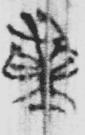朿（烈）
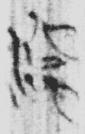流
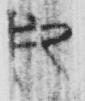女（如）
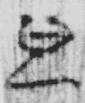也
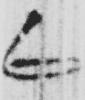㠯（以）
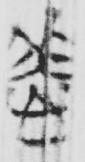悲
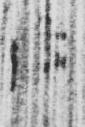攸
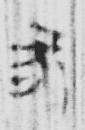肰（然）
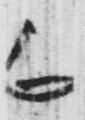㠯（以）
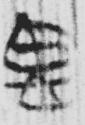思
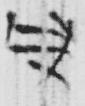凡
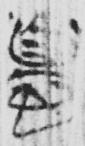憂
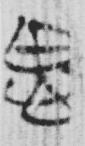思
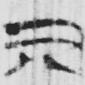而
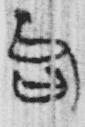句（後）
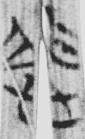悲
